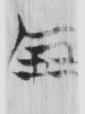朋
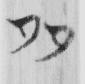多
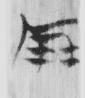朋
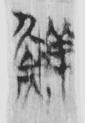鮮
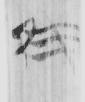隹
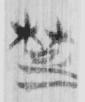楚
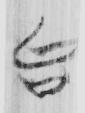台
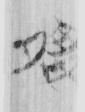{夕丮}
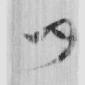夕
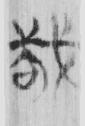{苟戈}
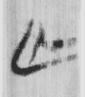亡
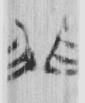非
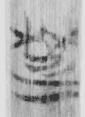楚
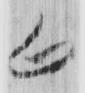㠯（以）
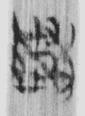{阜圭㕛力}
